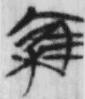集
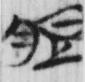脰（厨）
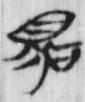鳴
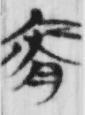○（夜）
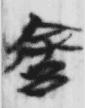舒
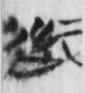○（率）
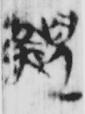鯢
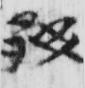○（鄢）
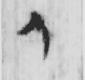人
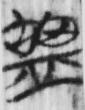○（盬）
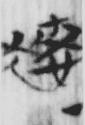憖
